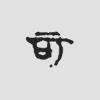可
